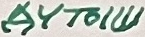дутыш
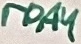грач
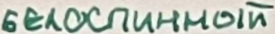белоспинный
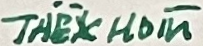таёжный
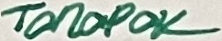топорок
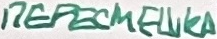пересмешка
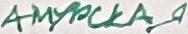амурская
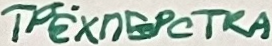трёхперстка
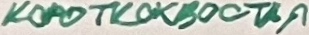короткохвостая
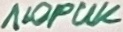люрик
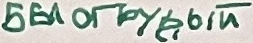белогрудый
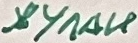жулан
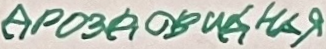дроздовидная
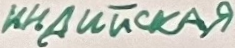индийская
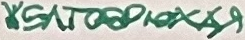желтобрюхая
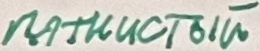пятнистый
